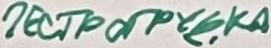пестрогрудка
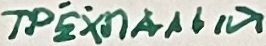трёхпалый
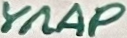улар
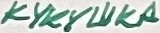кукушка
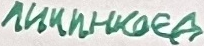личинкоед
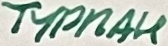турпан
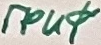гриф
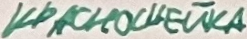красношейка
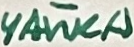чайка
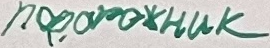подорожник
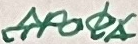дрофа
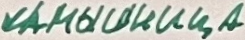камышница
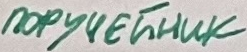поручейник
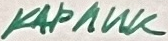карлик
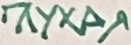глухая
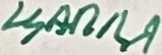цапля
